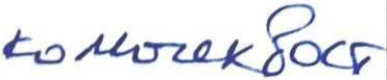колючехвост
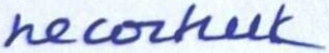песочник
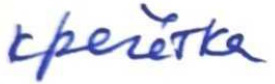кречётка
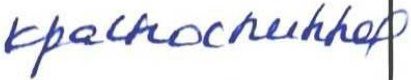красноспинная
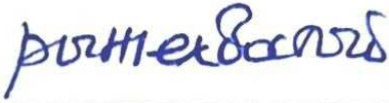рыжехвостый
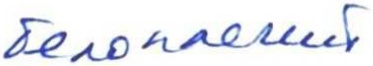белоплечий
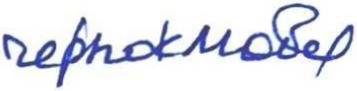черноклювая
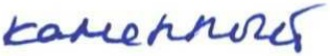каменный
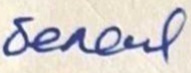белая
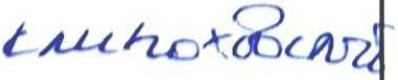клинохвостый
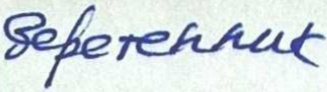веретенник
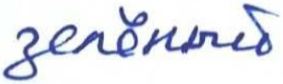зелёный
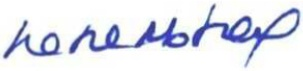попельная
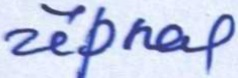чёрпая
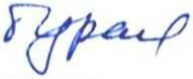бурая
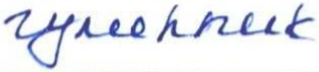гуменник
